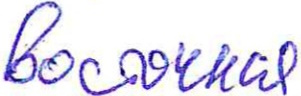восточная
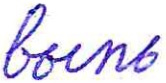выпь
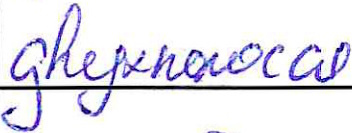двухполосая
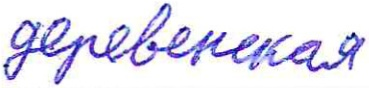деревенская
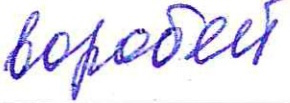воробей
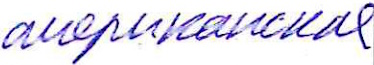американская
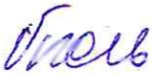бюль
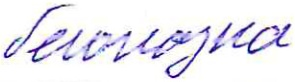бегоглазка
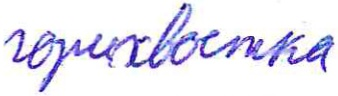горихвостка
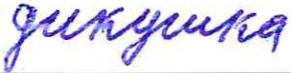дикушка
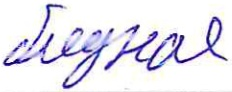бледная
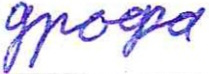дрофа
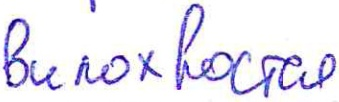вилохвостая
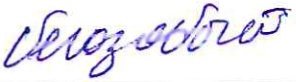белозобый
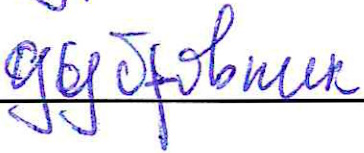дубровник
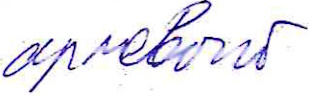арчевый
